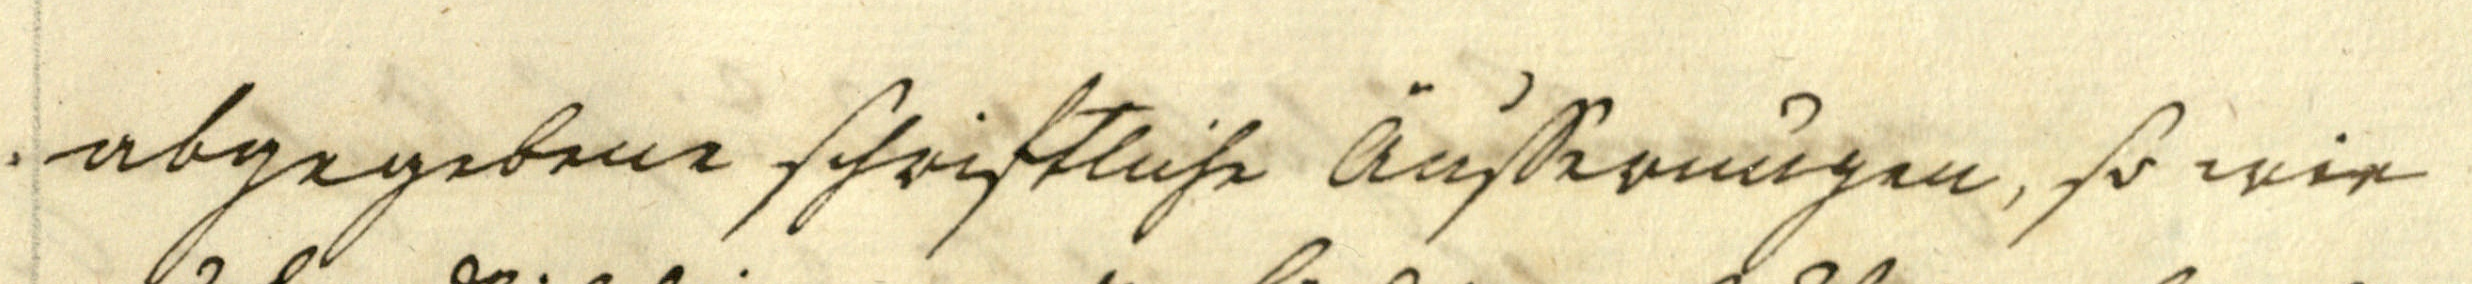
abgegebene schriftliche Äusserungen, so wie
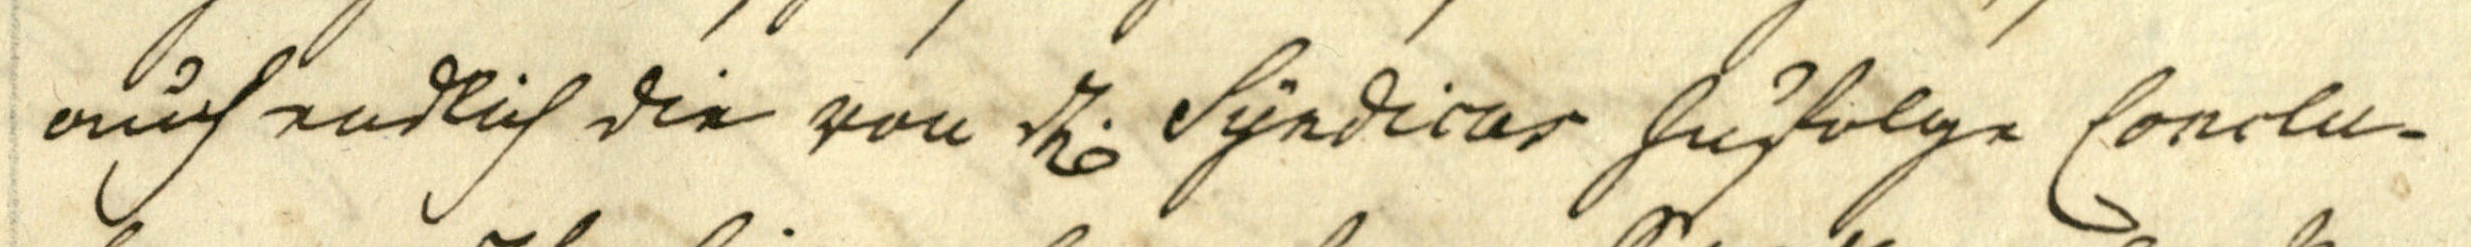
auch endlich die von dh. Sÿndicus zufolge Conclu¬
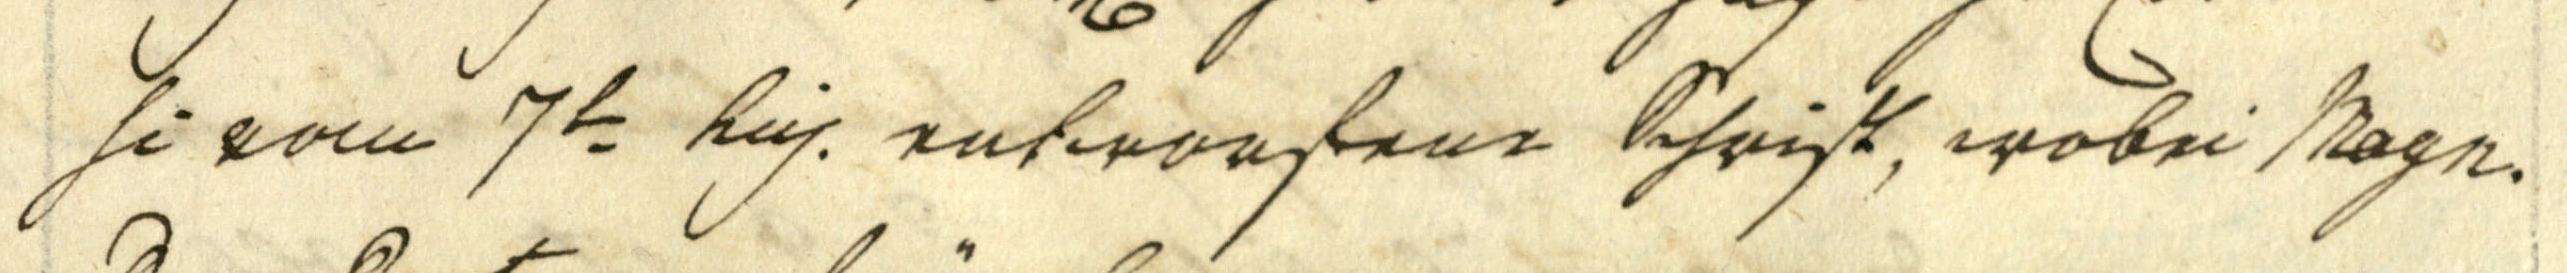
si vom 7 ten huj. entworfene Schrift, wobei Magn.
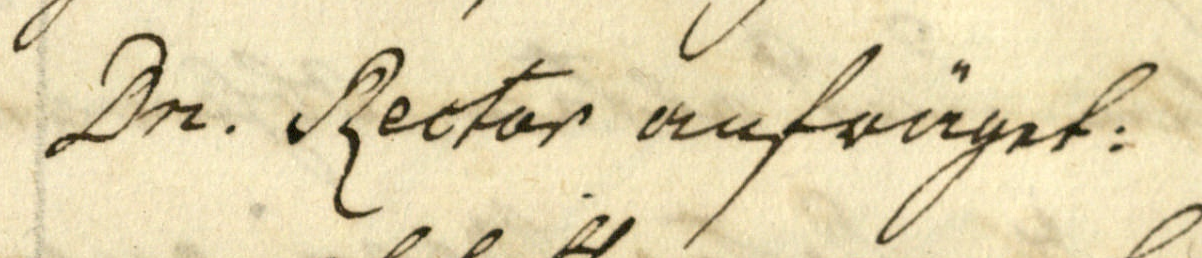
Dn. Rector anfräget:
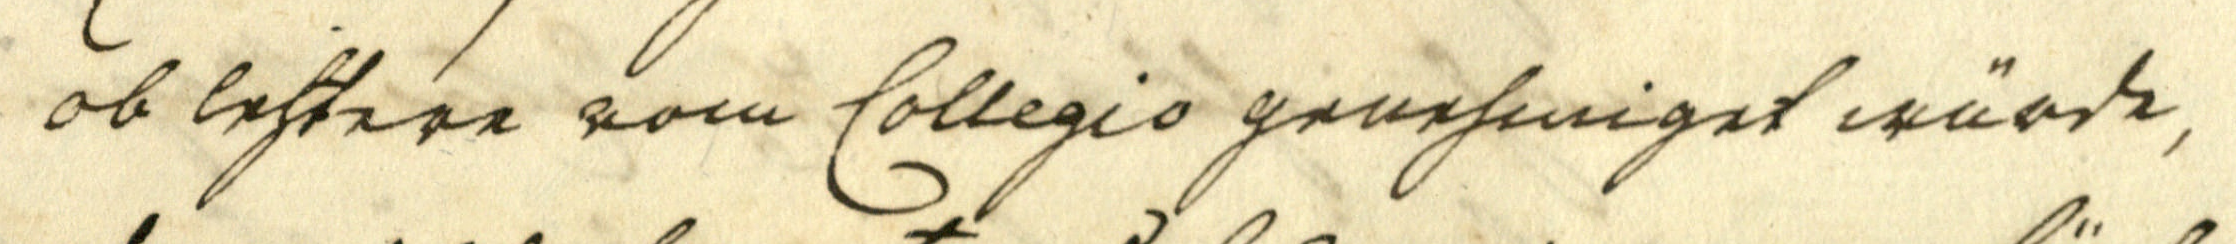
ob letztere vom Collegio genehmiget würde,
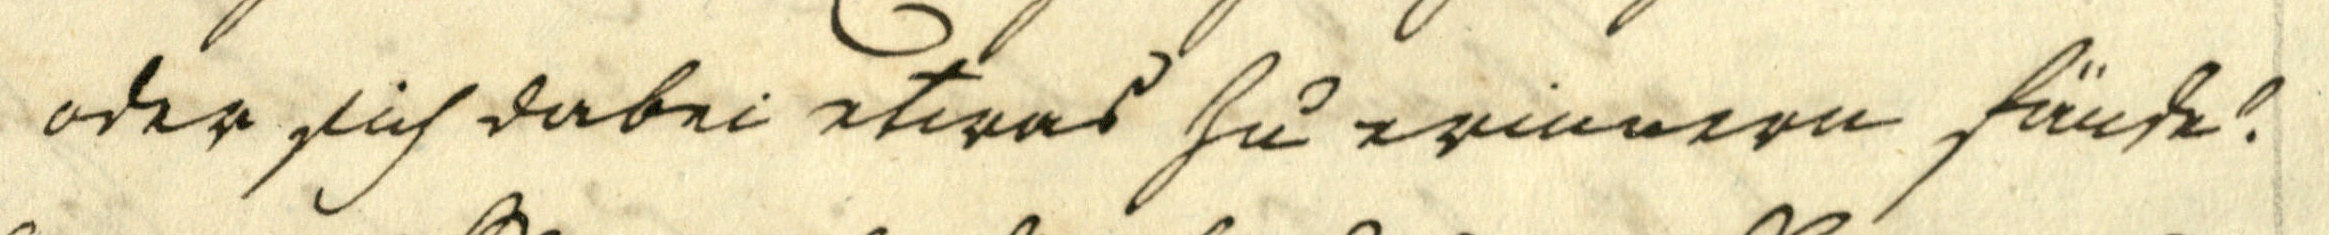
oder sich dabei etwas zu erinnern fände?.
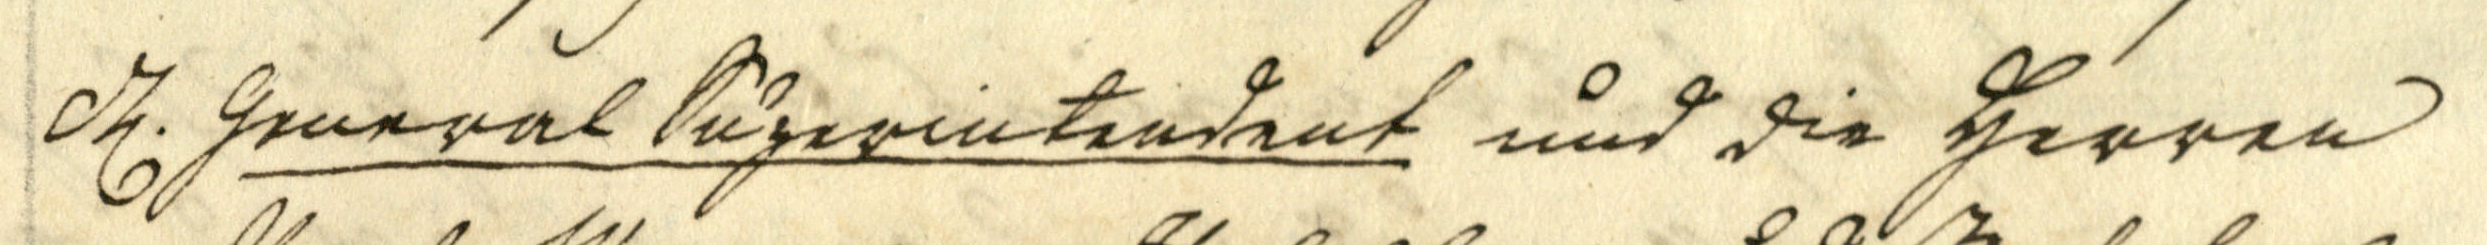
dh. General Superintendent und die Herren
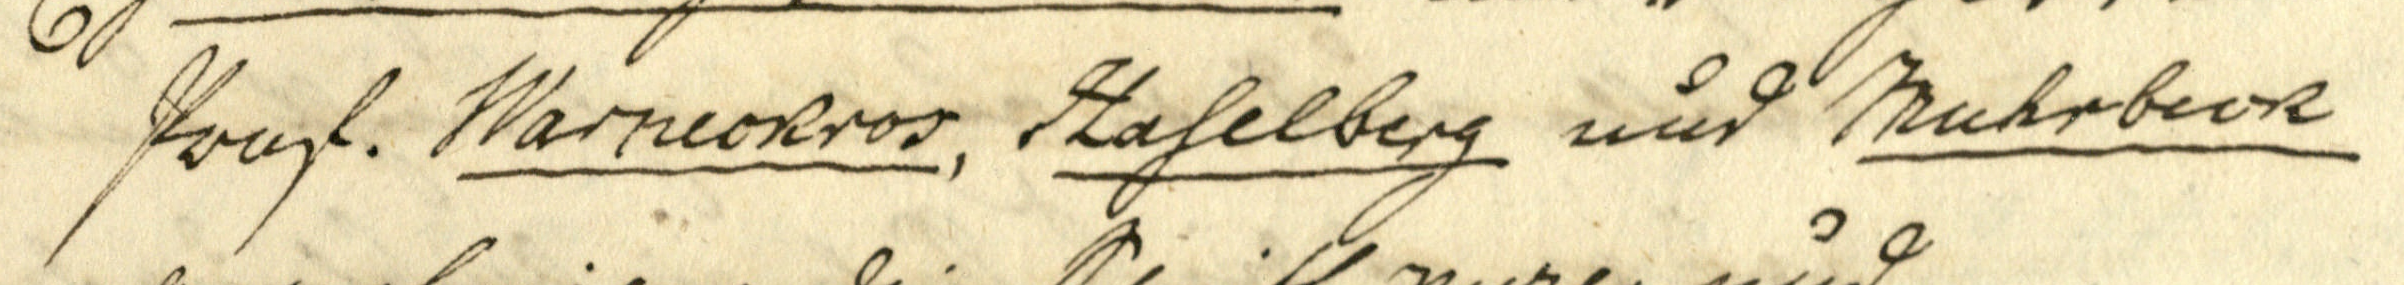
Prof. Warneckros, Haselberg und Muhrbeck
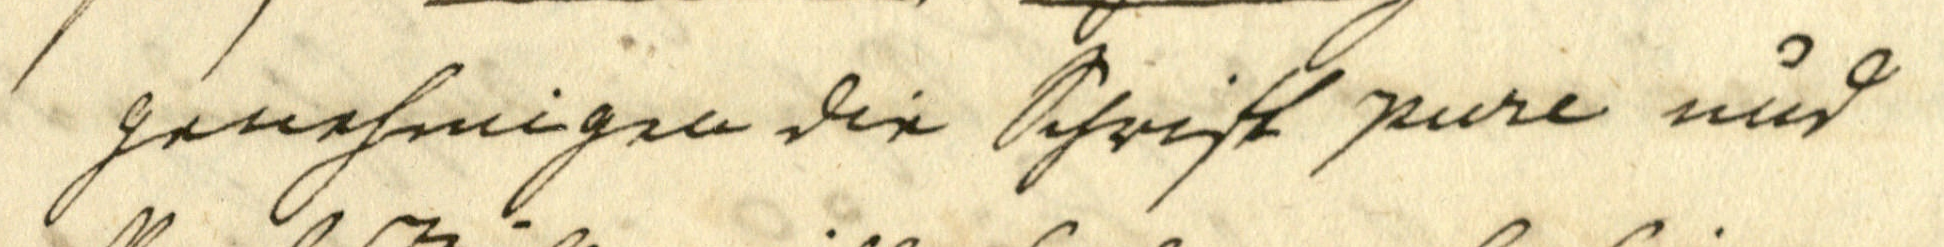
genehmigen die Schrift pure und
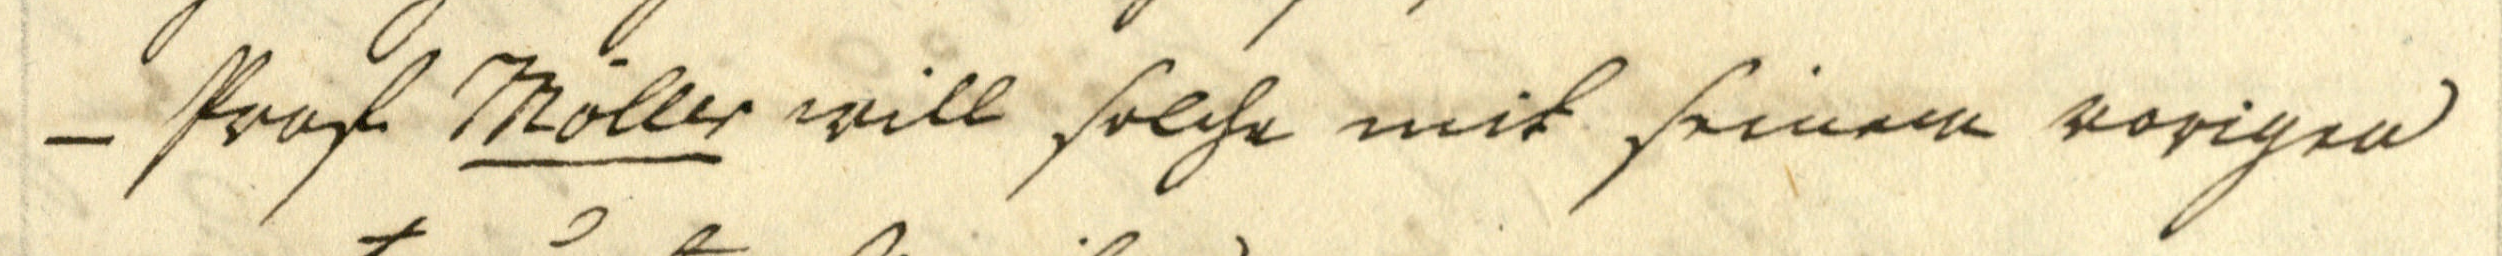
Prof. Möller will solche mit seinem vorigen
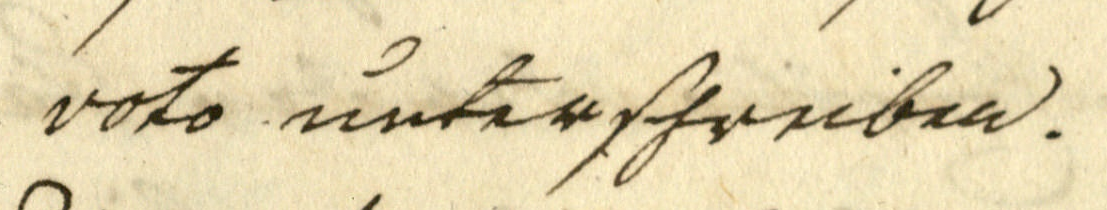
voto unterschreiben.
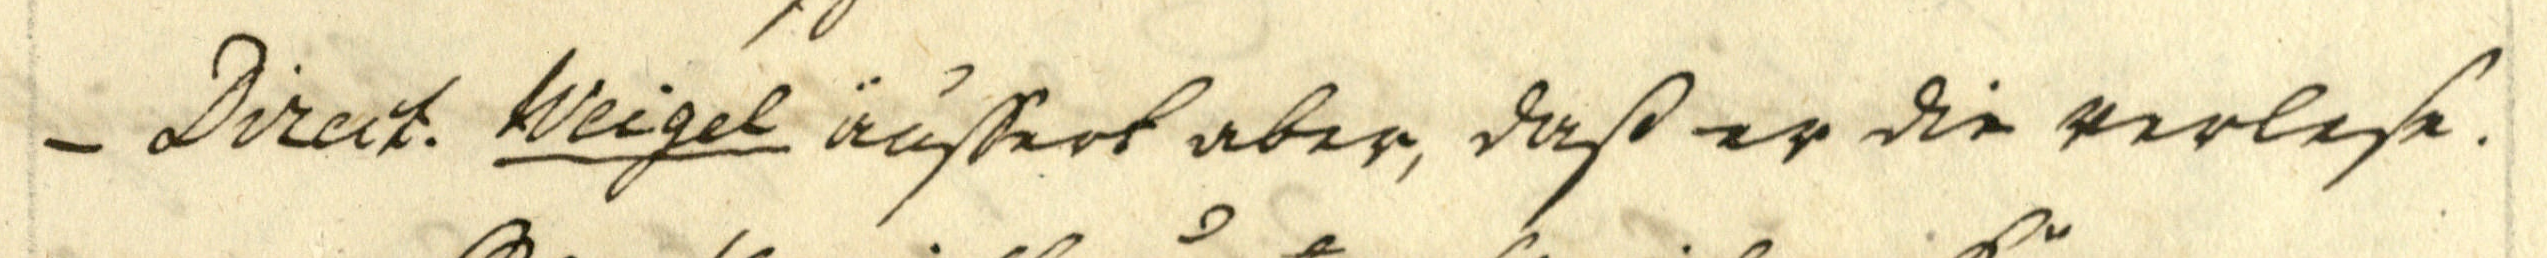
Direct. Weigel äussert aber, daß er die verlese¬
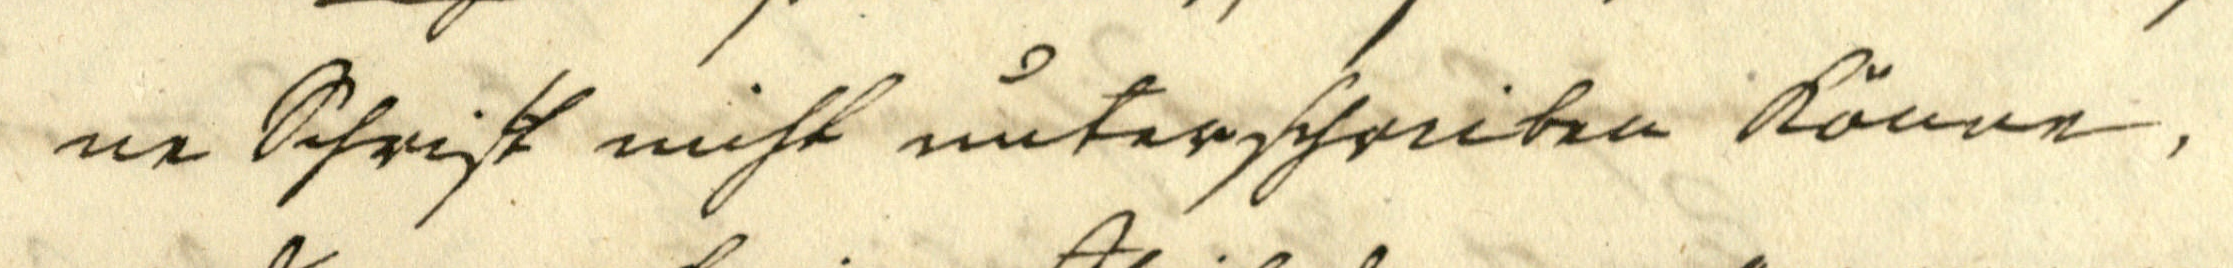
ne Schrift nicht unterschreiben könne,
